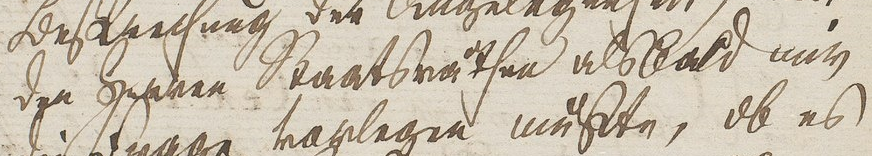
den Herren Staatsräthen alsbald mir
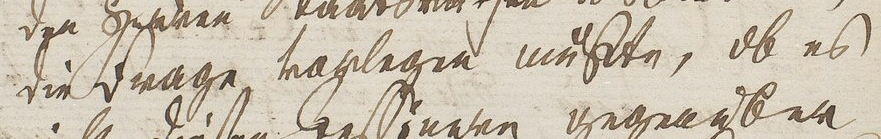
die Frage vorlegen müßte, ob es
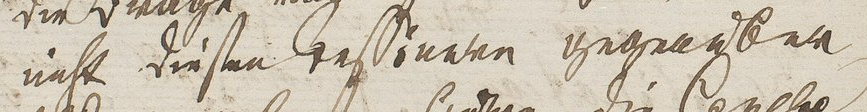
nicht diesen Tessinern gegenüber
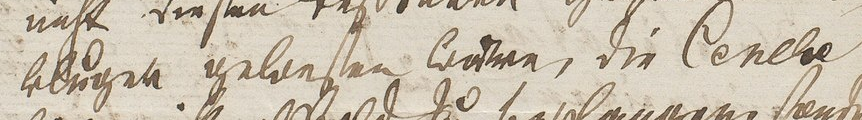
klüger gewesen wäre, die Cenere
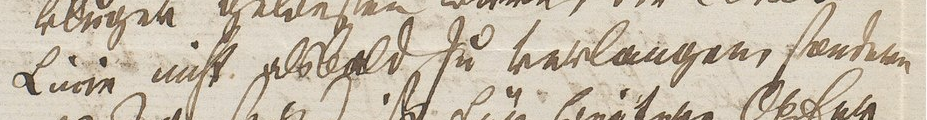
Linie nicht alsbald zu verlangen, sondern
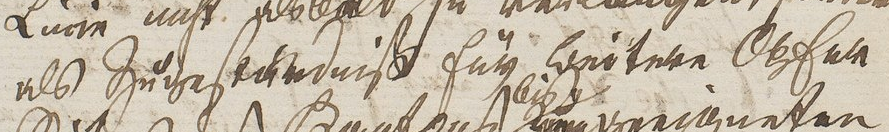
als Zugeständniß für weitere Opfer
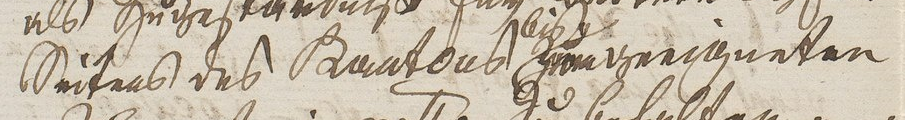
Seitens des Kantons bis zum geeigneten
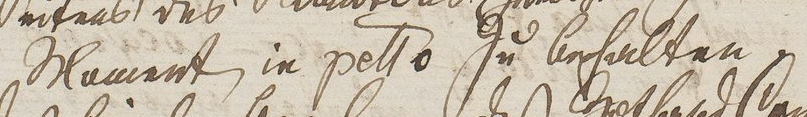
Moment in petto zu behalten.
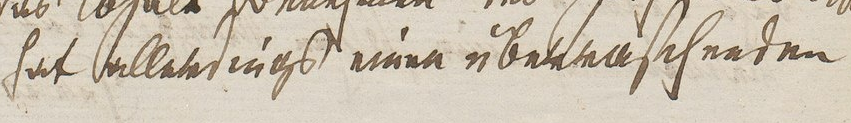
hat allerdings einen überraschenden
